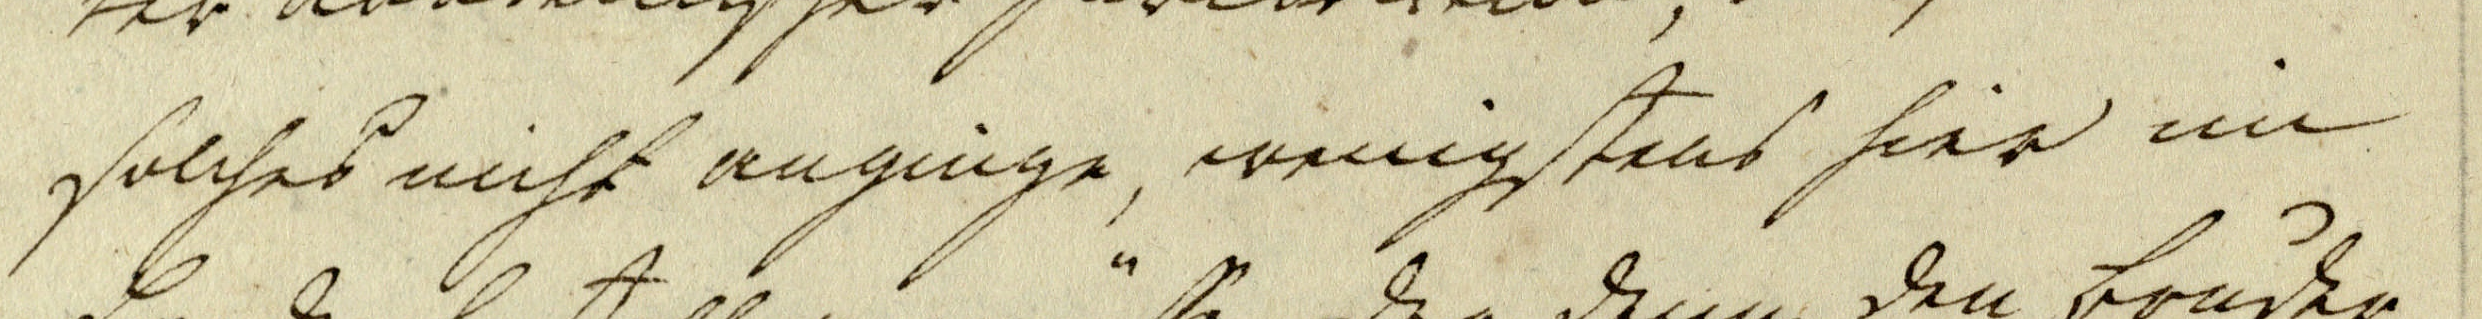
solches nicht anginge, wenigstens hier im
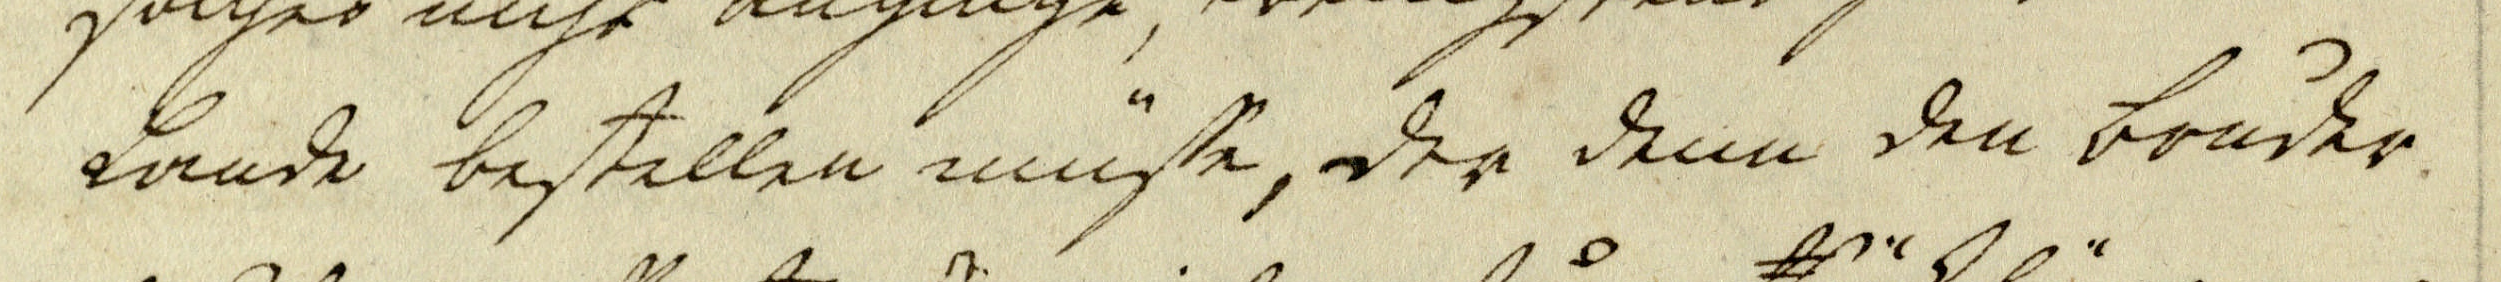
Lande bestellen müsse, der denn den Bruder
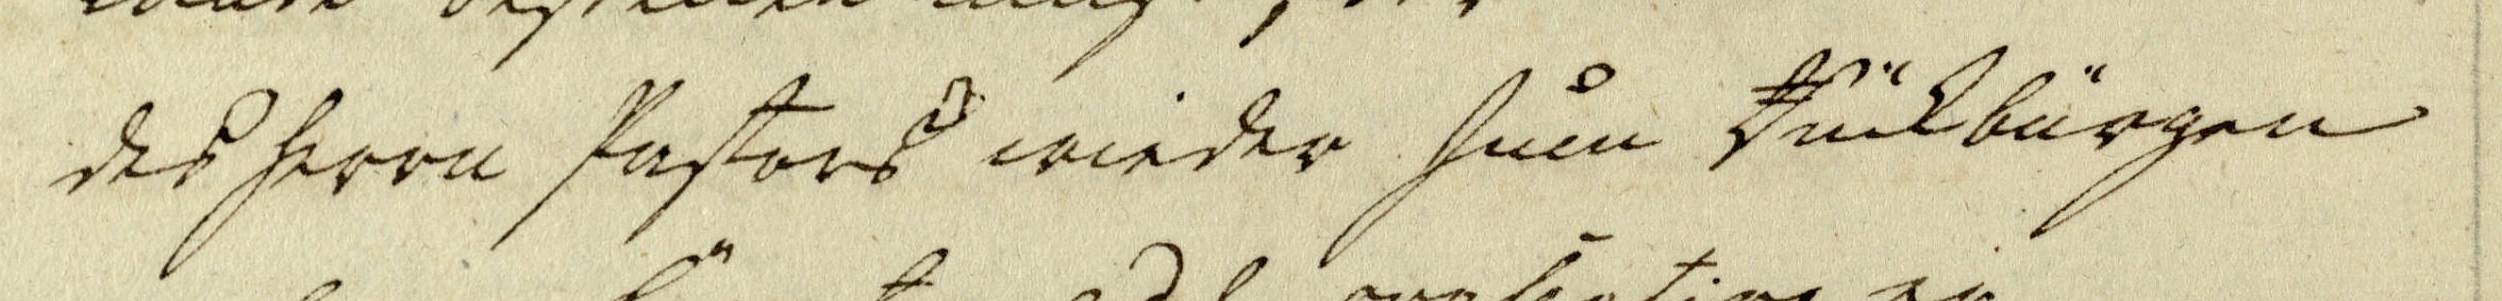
des Herrn Pastors wieder zum Rückbürgen
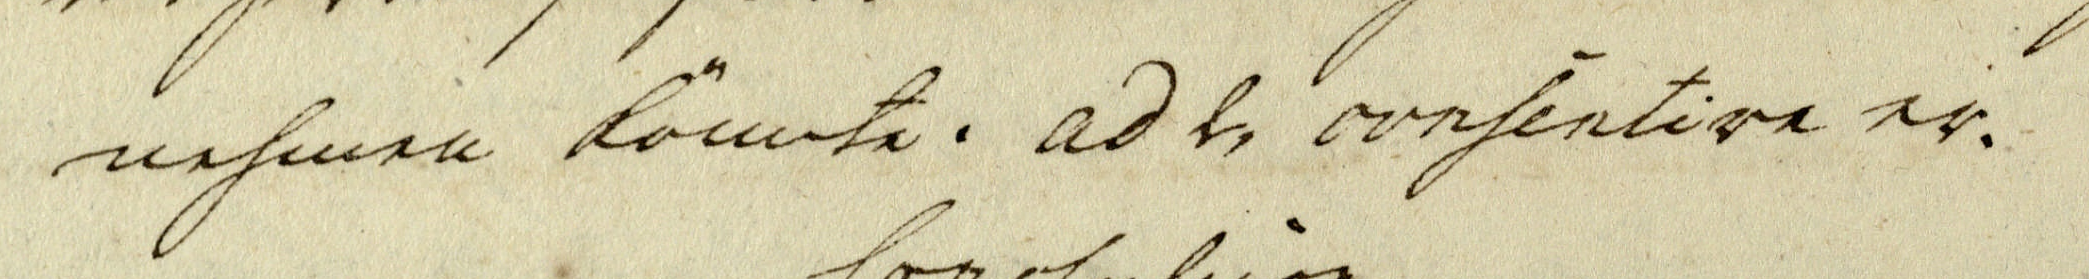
nehmen könnte. ad 2., consentire er.
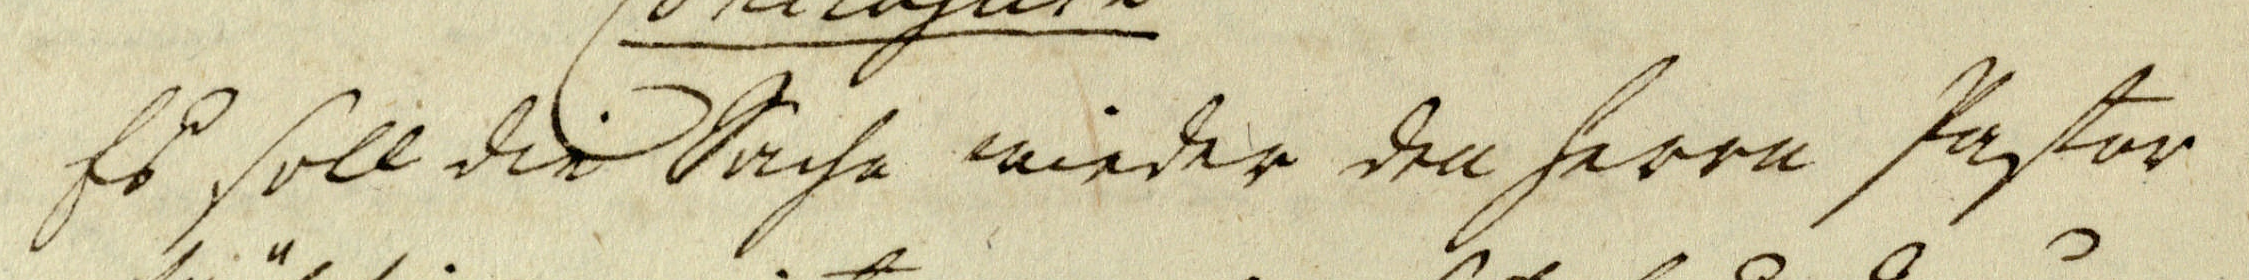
Es soll die Sache wieder den Herrn Pastor
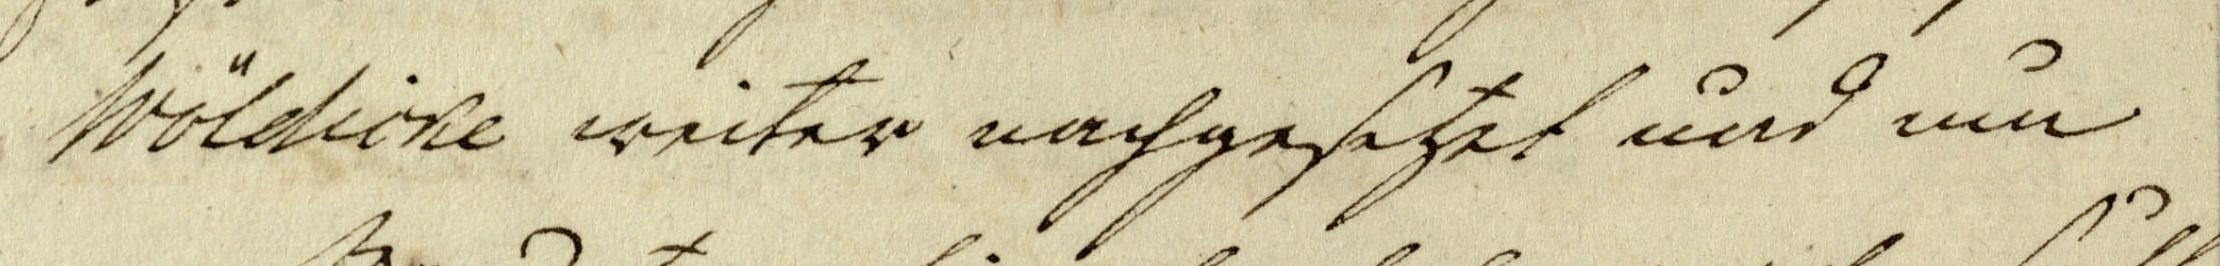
Wöldicke weiter nachgesetzet und um
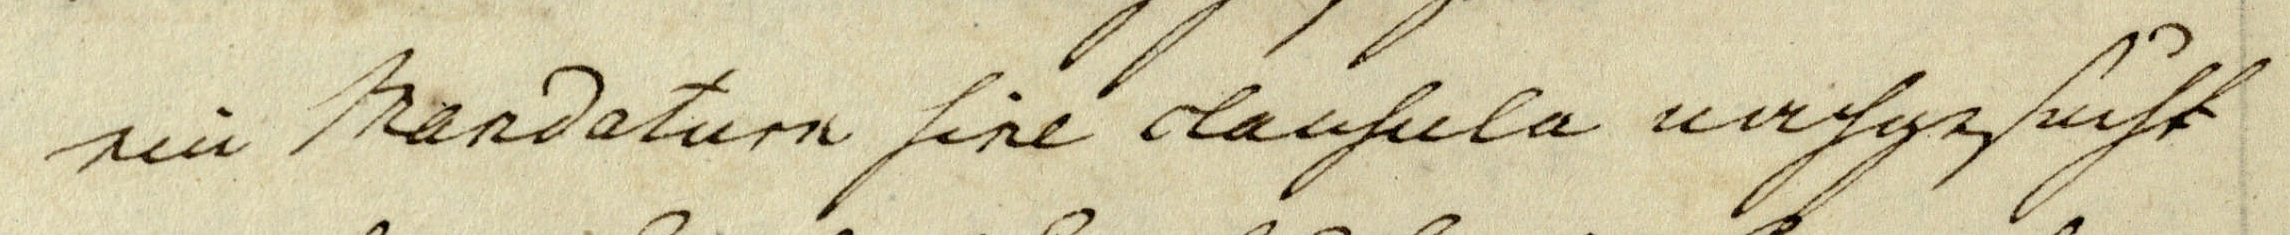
ein Mandatum sine clausula nachgesucht
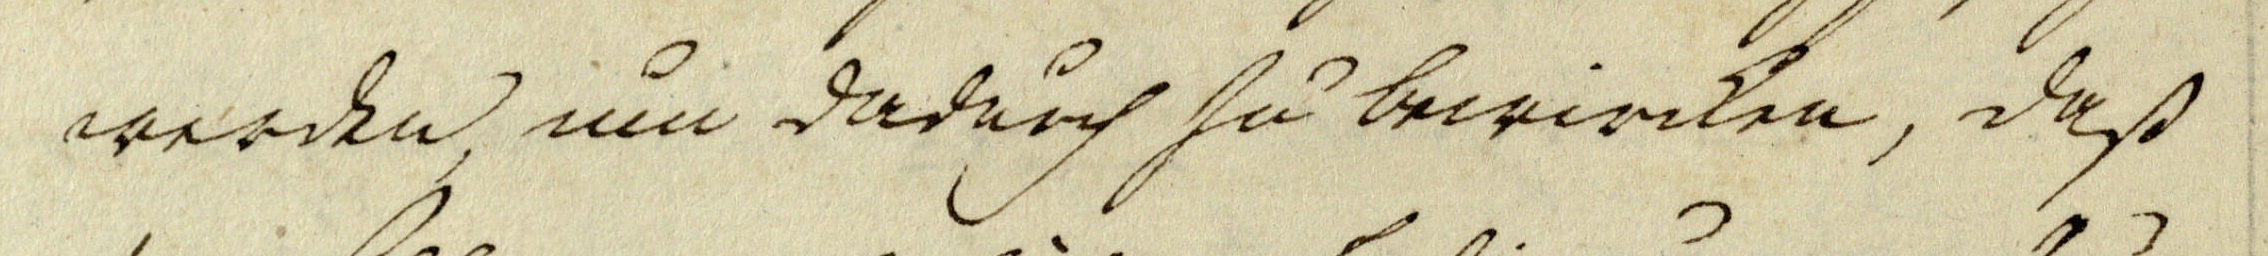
werden, um dadurch zu bewircken, daß
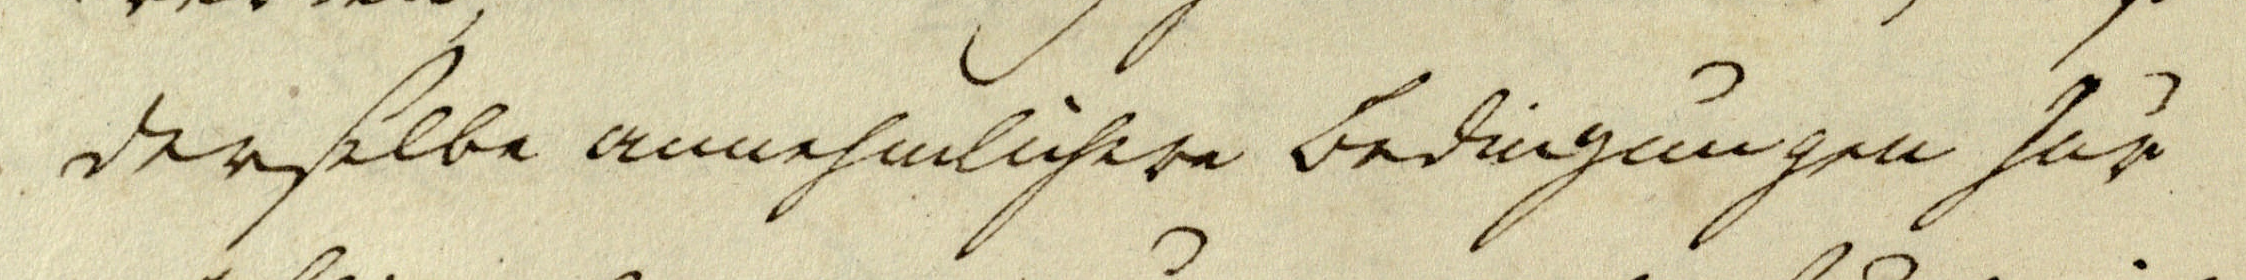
derselbe annehmlichere Bedingungen zur
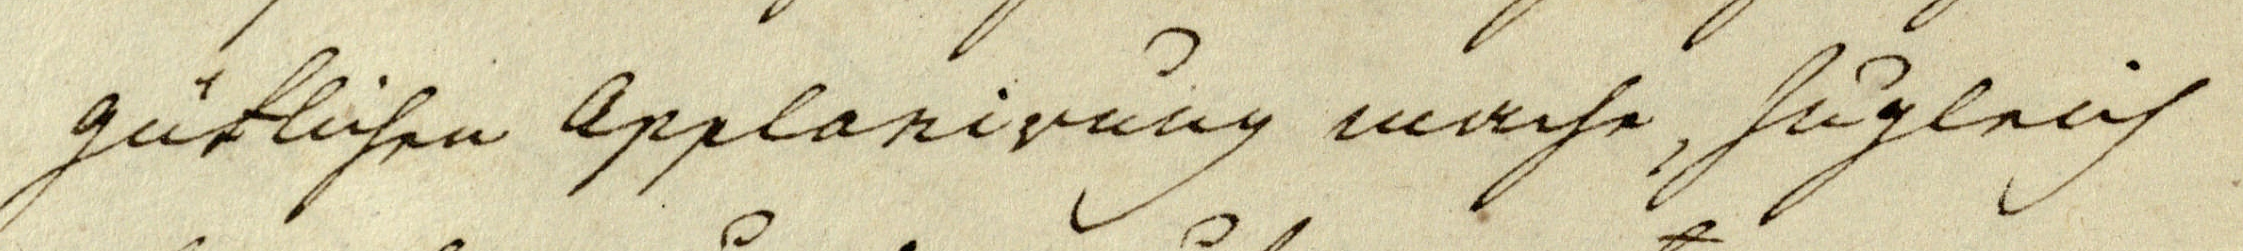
gütlichen Applanirung mache, zugleich
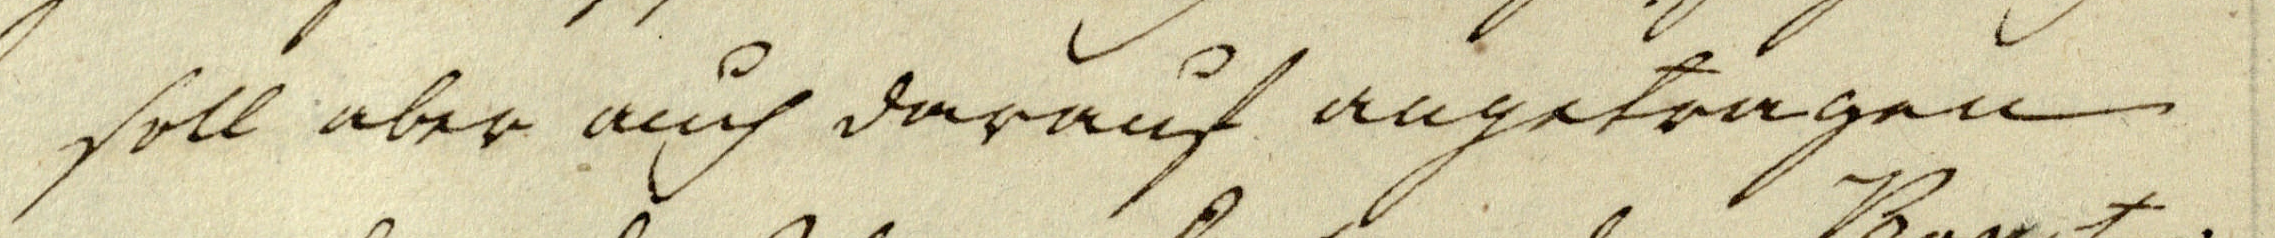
soll aber auch darauf angetragen
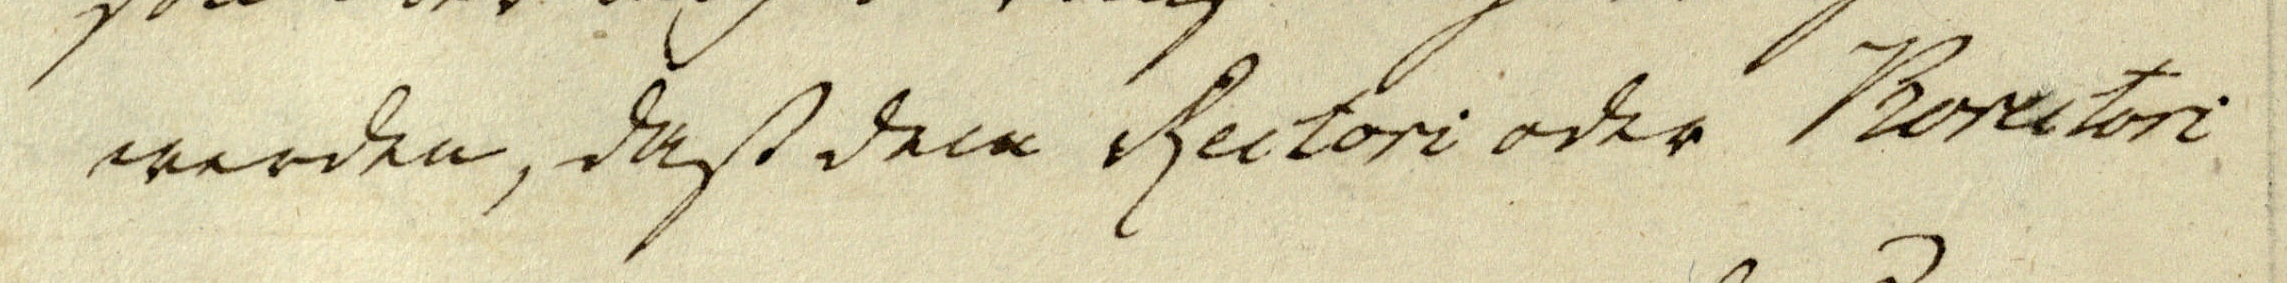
werden, daß dem Rectori oder Porectori
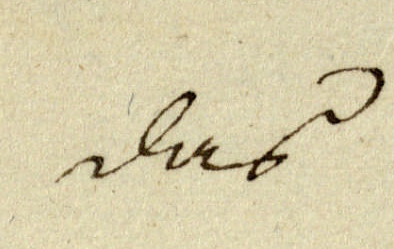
das
